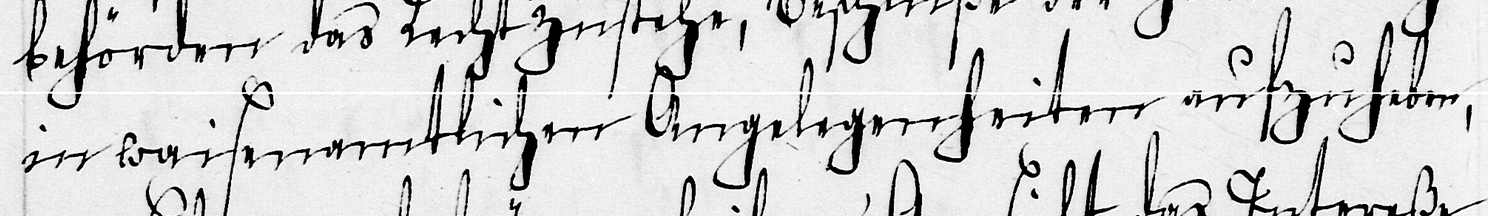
in waisenamtlichen Angelegenheiten aufzuheben,
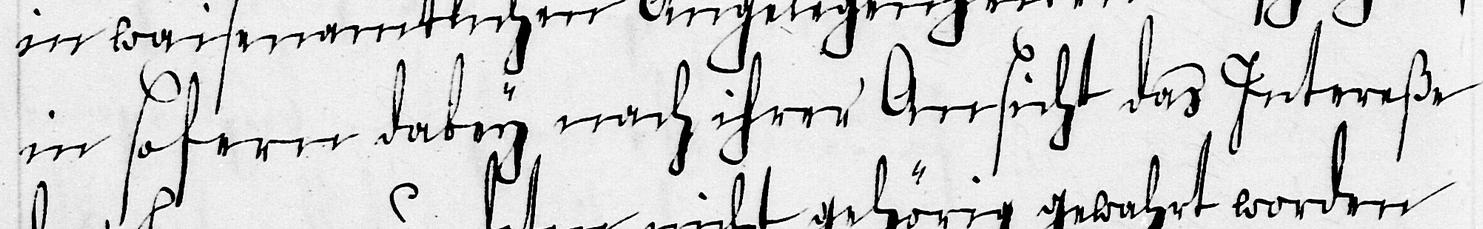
in sofern dabey nach ihrer Ansicht das Intereße
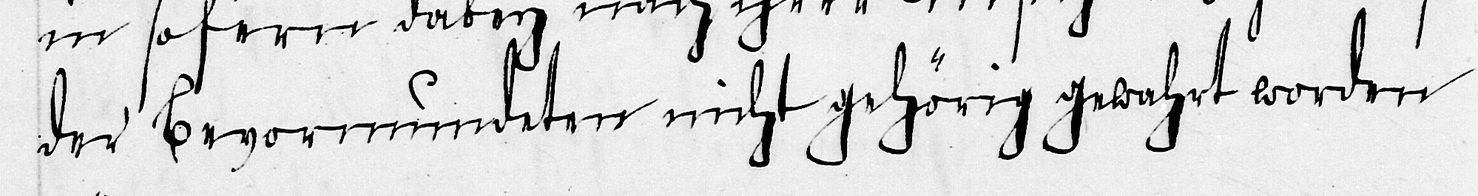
der Bevormundeten nicht gehörig gewahrt worden
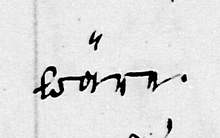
wäre.
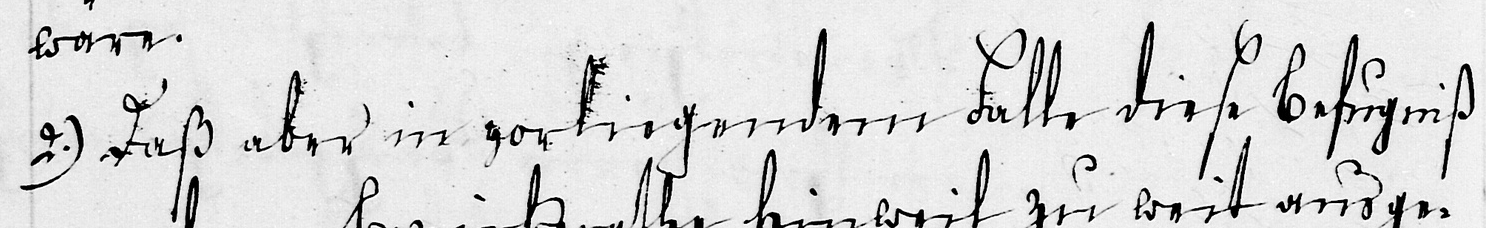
2.) Daß aber in vorliegendem Falle diese Befugniß
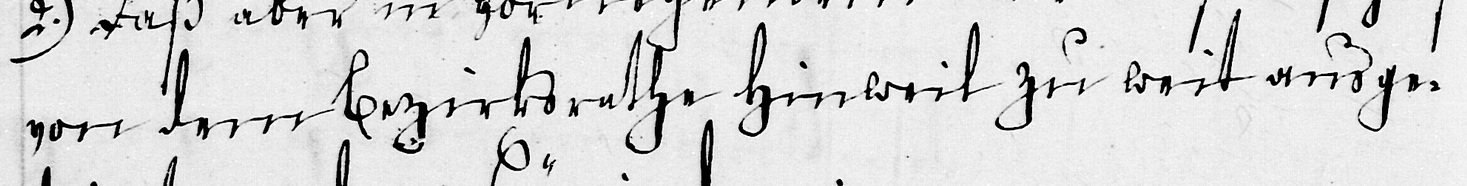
von dem Bezirksrathe Hinweil zu weit ausge¬
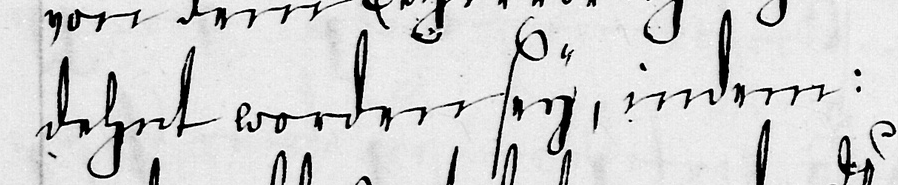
dehnt worden sey, indem:
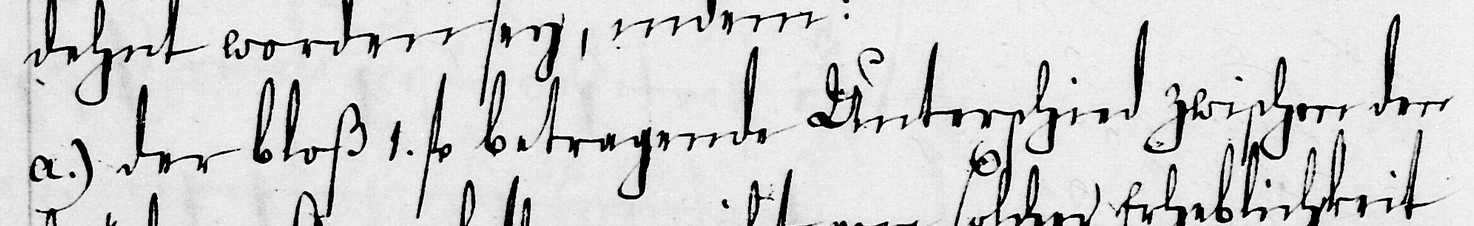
a.) der bloß 1. fl. betragende Unterschied zwischen den
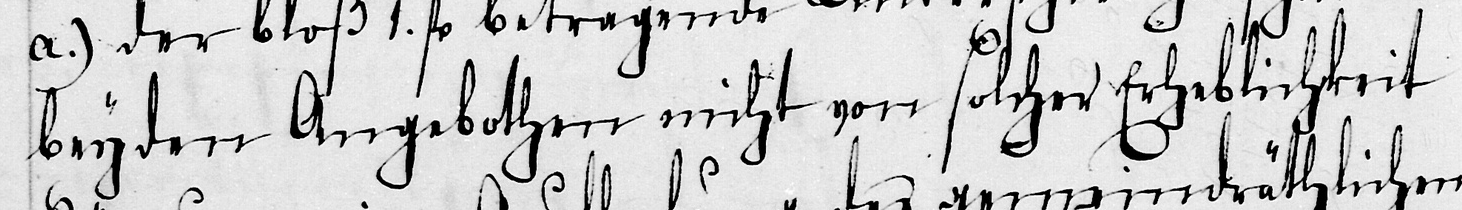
beyden Angebothen nicht von solcher Erheblichkeit
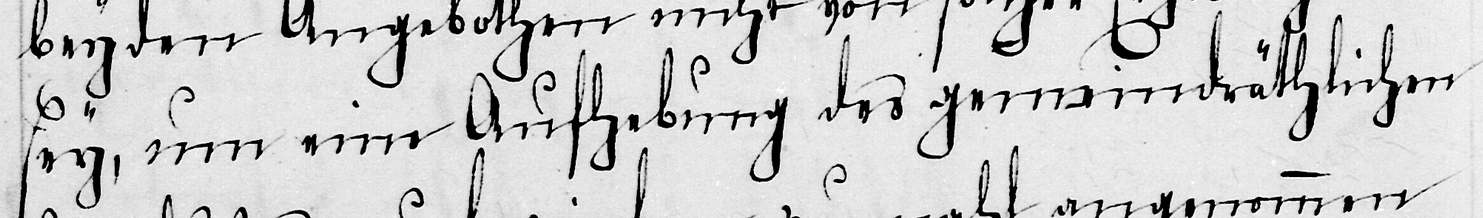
sey, um eine Aufhebung des gemeindräthlichen
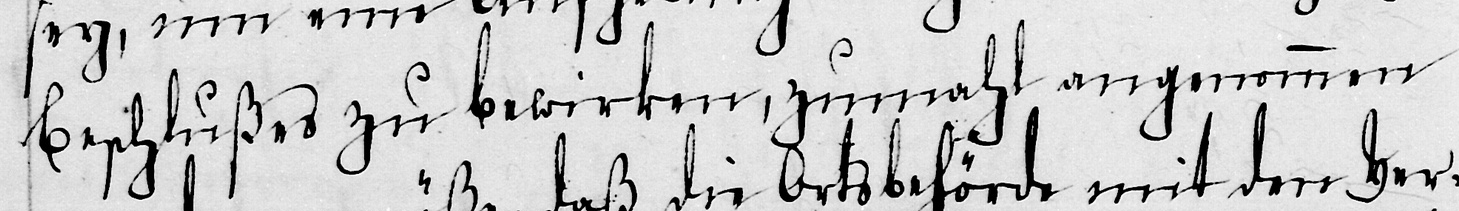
Beschlußes zu bewirken, zumahl angenommen
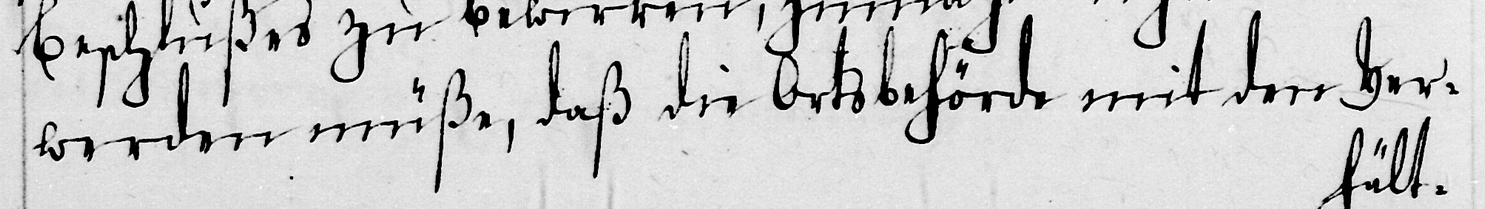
werden müße, daß die Ortsbehörde mit den Ver-
